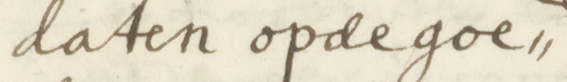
daten opde goe„
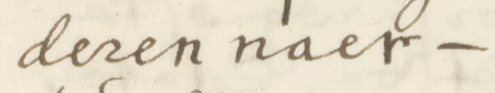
deren naer —
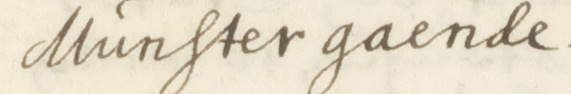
Munster gaende
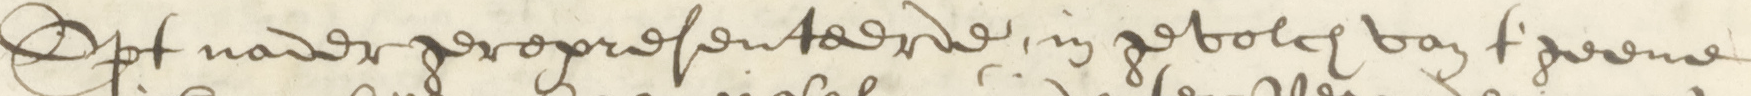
Opt nader gerepresenteerde, in gevolch van t'geene
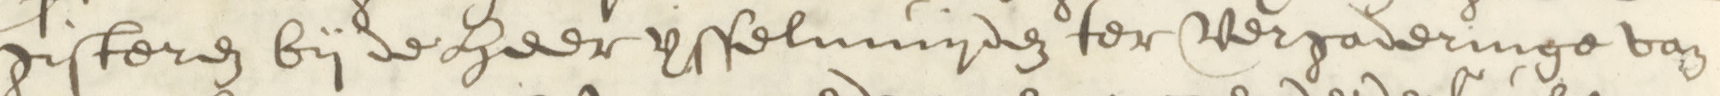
gisteren bij de heer Ysselmuijden ter Vergaderinge van
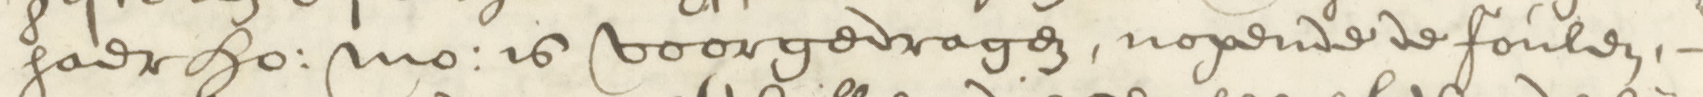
haer Ho:Mo: is voorgedragen, nopende de foulen,
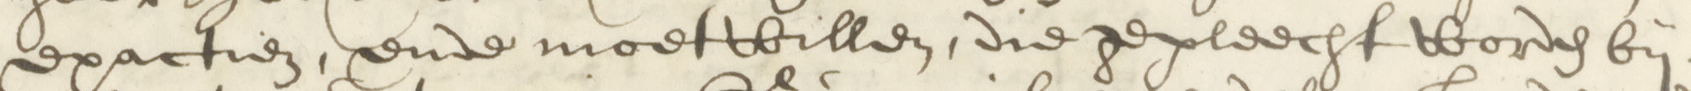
exactien, ende moetwillen, die gepleecht worden bij
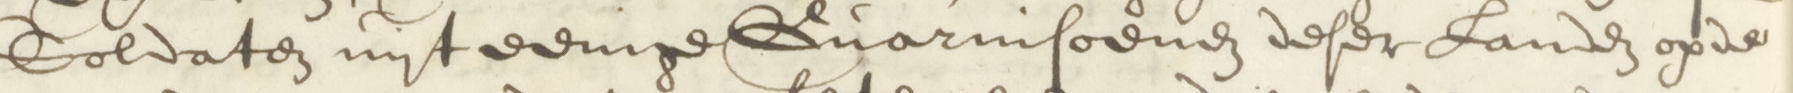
Soldaten uijt eenige Guarinsoenen deser Landen opde
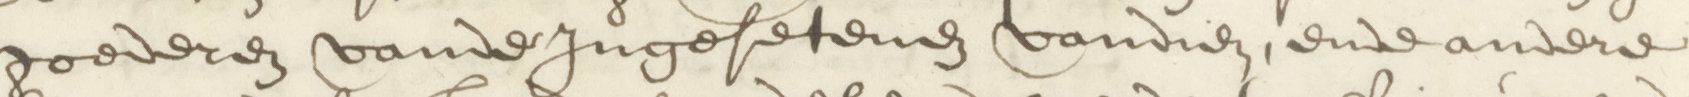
goederen vande Ingesetenen vandien, ende andere
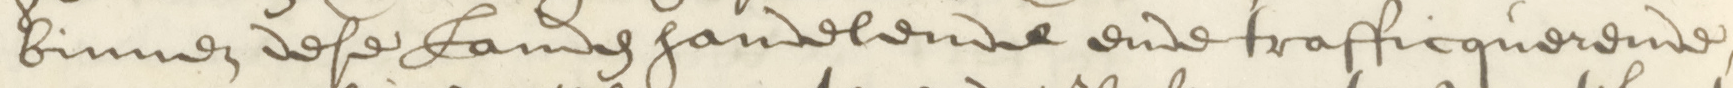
binnen dese Landen handelende ende trafficquerende
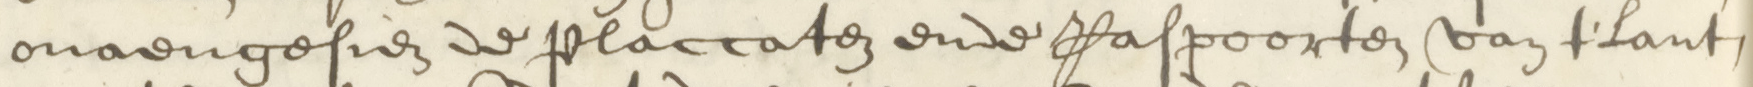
onaengesien de placcaten ende paspoorten van t'Lant,
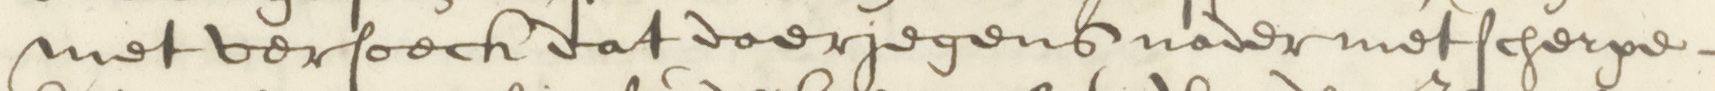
met versoeck dat daerjegens nader met scherpe
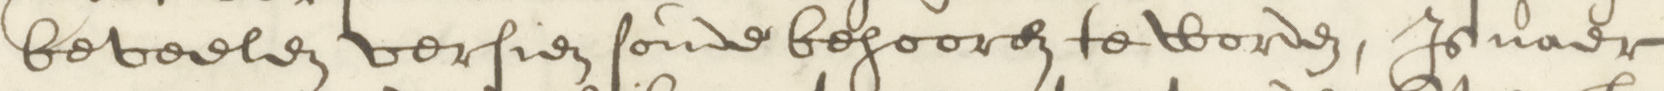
beveelen versien soude behooren te worden, Is naer
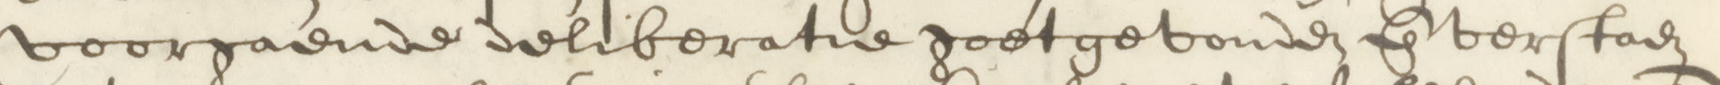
voorgaende deliberatie goetgevonden & verstaen
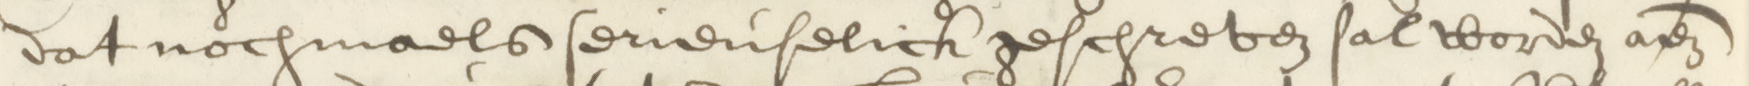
dat nochmaels serieuselick geschreven sal worden aen
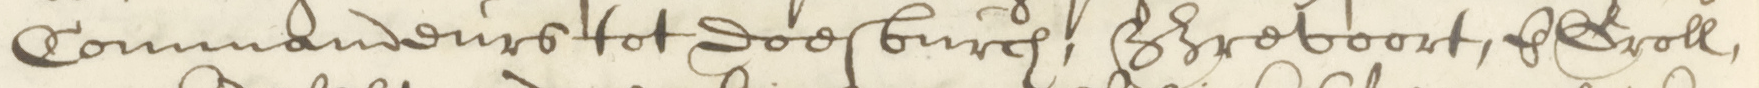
Commandeurs tot Doesburch, Brevoort, & Groll,
